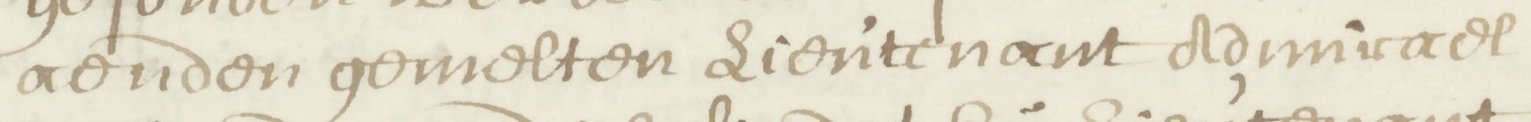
aenden gemelten Lieutenant Admirael
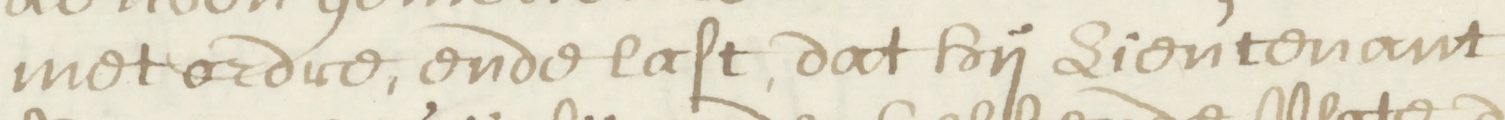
met ordre, ende last, dat hij Lieutenant
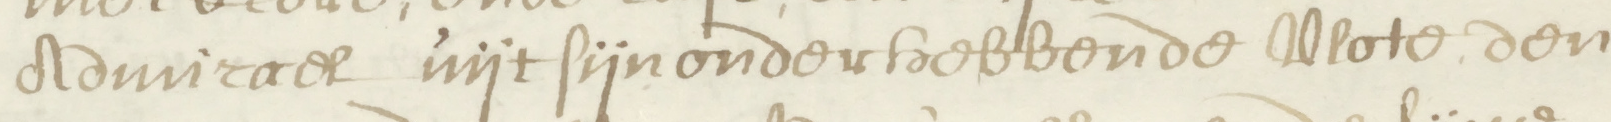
Admirael uijt sijn onderhebbende Vlote, den
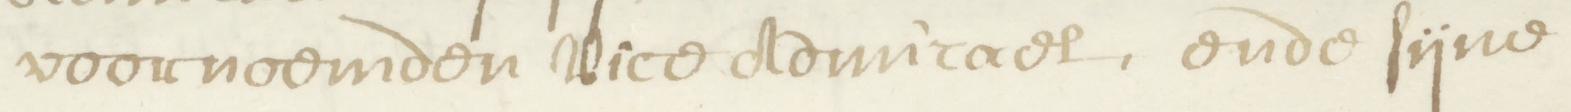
voornoemden Vice Admirael, ende sijne
